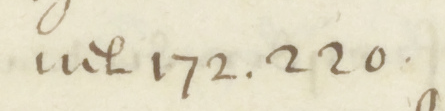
nel 172. 220.
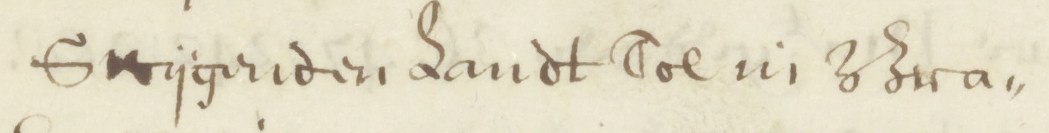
Swijgenden Landt Tol in Bra„
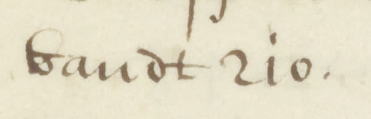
bandt 210.
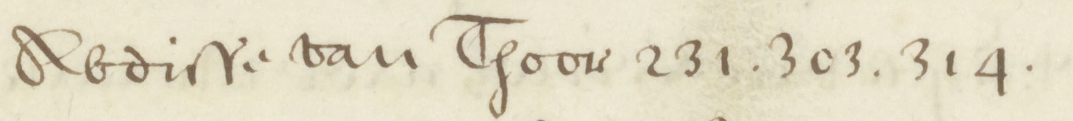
Abdisse van Thoor 231. 303. 314.
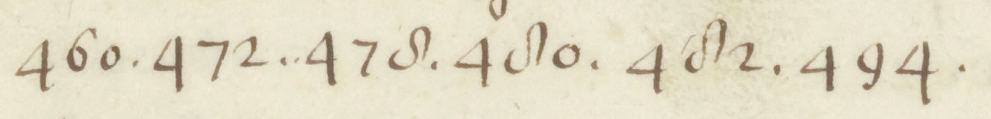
460. 472. 478. 480. 482. 494.
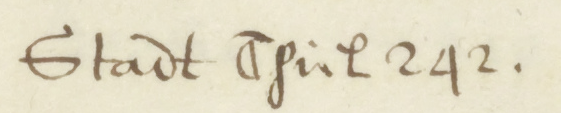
Stadt Thiel 242.
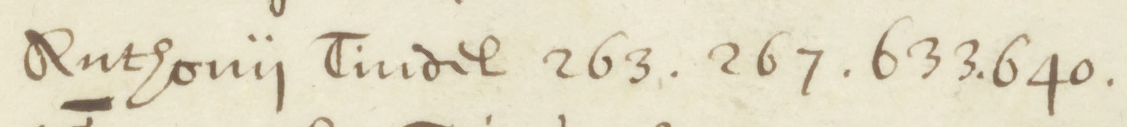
Anthonij Tindel 263. 267. 633. 640.
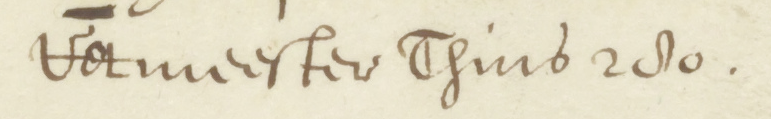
Retmeester Thins 280.
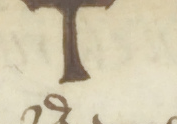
T
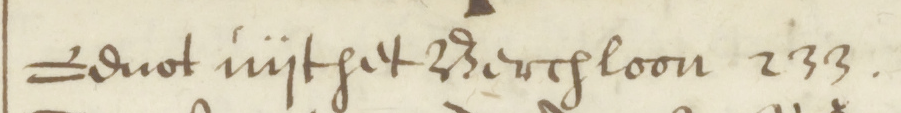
Genot uijt het Berchloon 233.
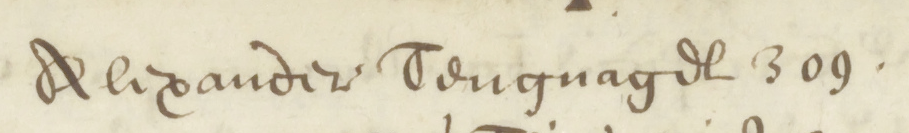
Alexander Tengnagel 309.
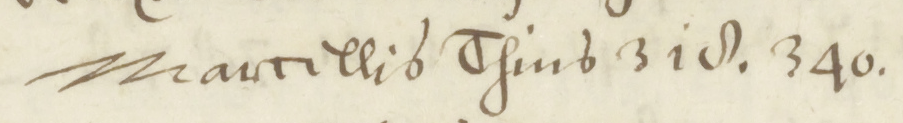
Marcellis Thins 318. 340.
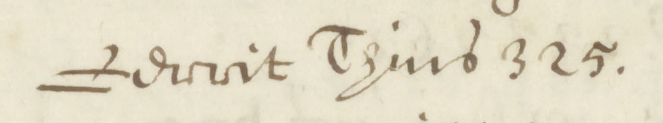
Gerrit Thins 325.
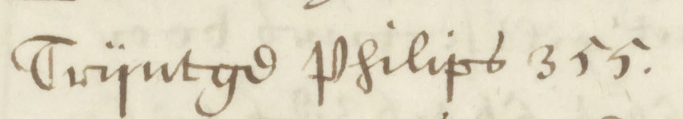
Trijntge Philips 355.
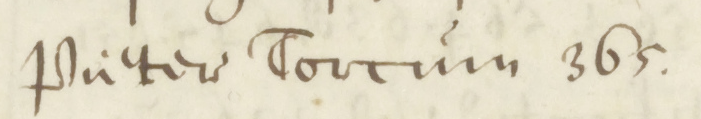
Pieter Torcum 365.
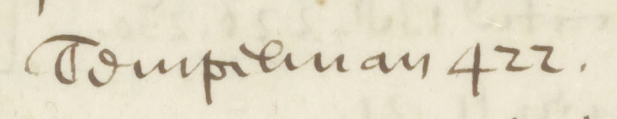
Tempelman 422.
